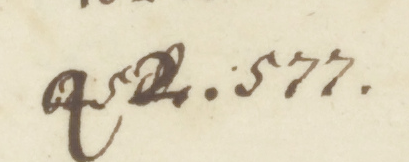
452, 577.
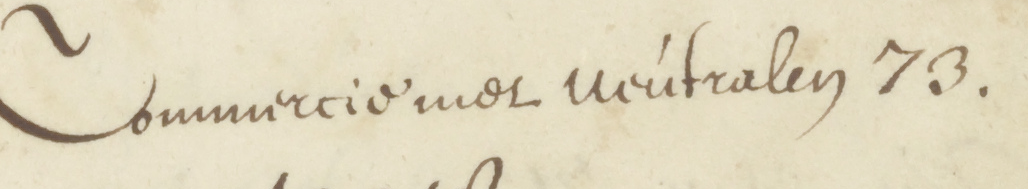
Commercie met neutralen 73,
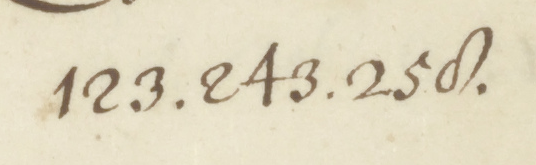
123, 243, 258.
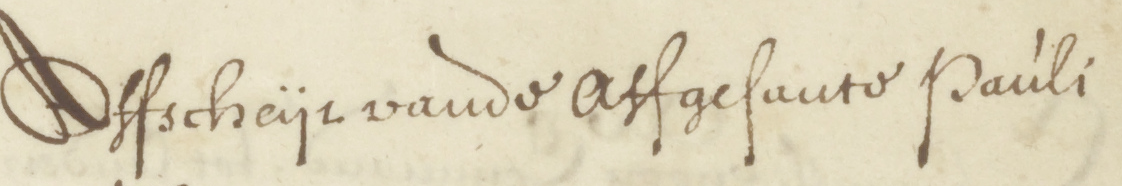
Affscheijt vande Affgesante Pauli
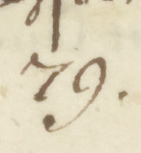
79.
